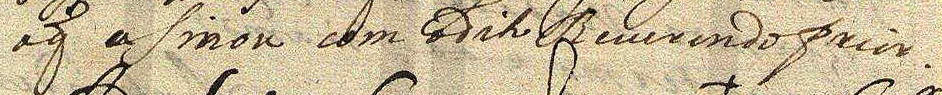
o q̄ asinou com o dito Reuerendo prior
